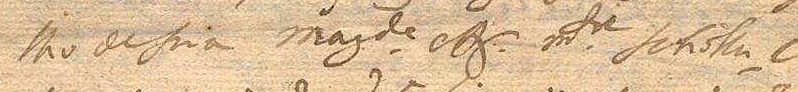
lho de sua magd.e etc. m.tre scholla E
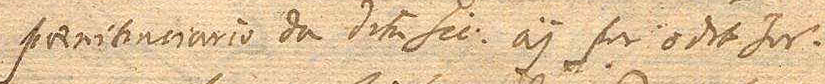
pœnitenciario da dita seé. aj por o dito sor.
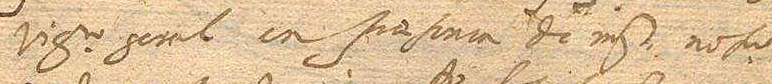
vig.ro geral em presença de mj̄ notro
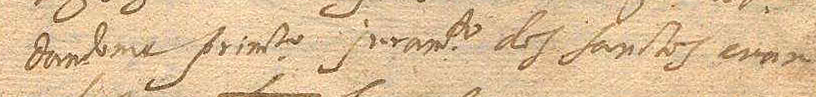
dandome prim.ro juram.to dos sanctos evan
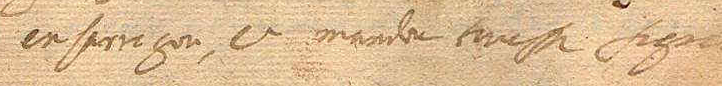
enCarregou, e mandou teuesse segredo
